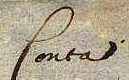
Conta
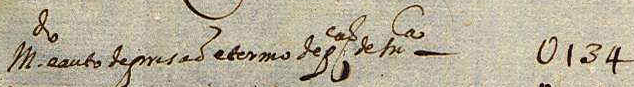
M.do e auto de prisaõ e termo de pçaõ de snCa – $134
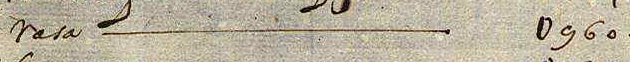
Rasa – $960
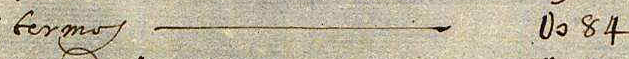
termos – $084
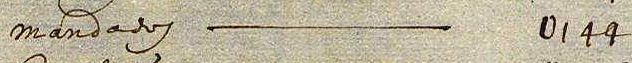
mandados – $144
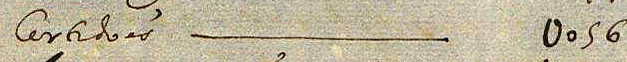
Certidoẽs – $056
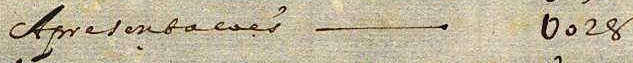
Apresentações – $028
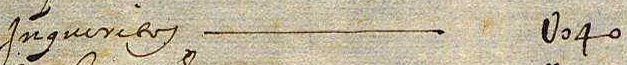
Jnqueritos – $040
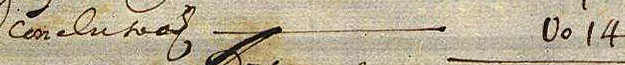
conclusoaõ – $014
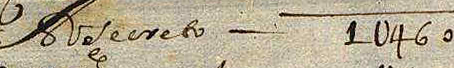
Ao secreto – 1$460
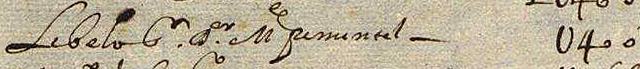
Libelo s.or D.or Mel pimentel – $400
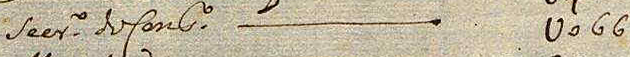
Secr.o do Cons.o – $066
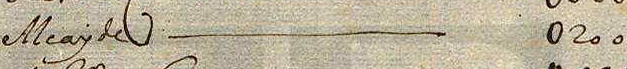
Alcayde – $200
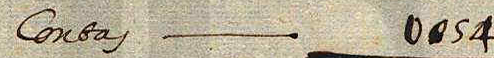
Contas – $054
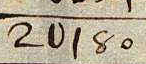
2$180
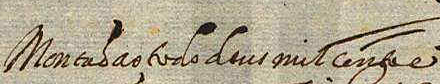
Montaõ ao todo dous mil cento e
